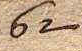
62
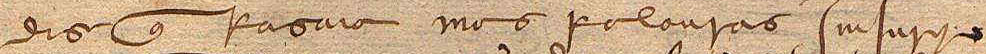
dise q̄ pasara mas palauras JmJuryo
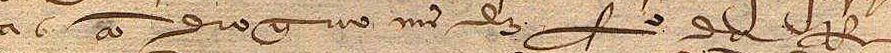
sas c̄o dioguo mēdez fo da Re
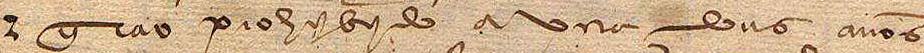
ē grao prohybydo avera dous anōs
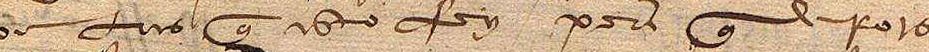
ou tres q̄ esto foy porē q̄ depojs
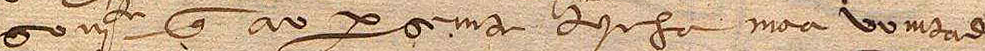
somte q̄ ao ꝑsemte tynha maa voomtade
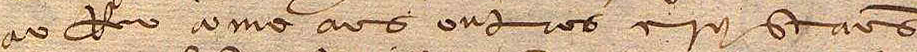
ao Reo como aos outros crystaõs
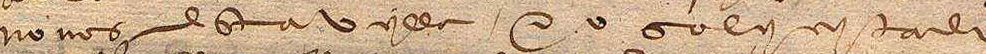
nouos desta vylla / e o solycytador
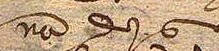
nā dyse
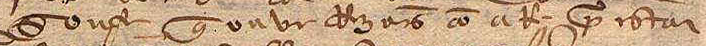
Somte q̄ ouve Rezoẽs c̄o a Re p̄o estar
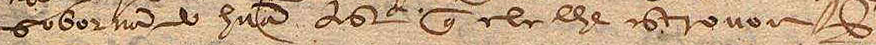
sobornādo huā testa q̄ ela lhe estrouou //
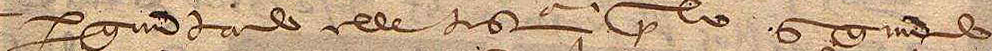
item ꝑgun̄tado elle testa p̄lo seguūdo
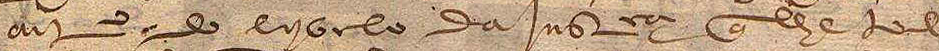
arto do lybelo da Justça q̄ lhe todo
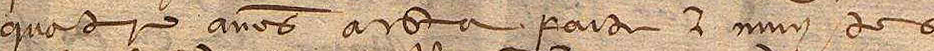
quatro anōs a esta parte ē muytos
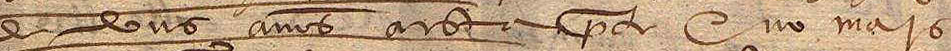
de dous an̄os a esta p̄te e no majs
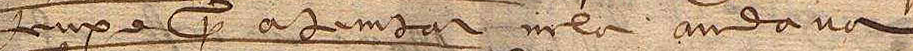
tenpo p̄o atemtar nela andaua
